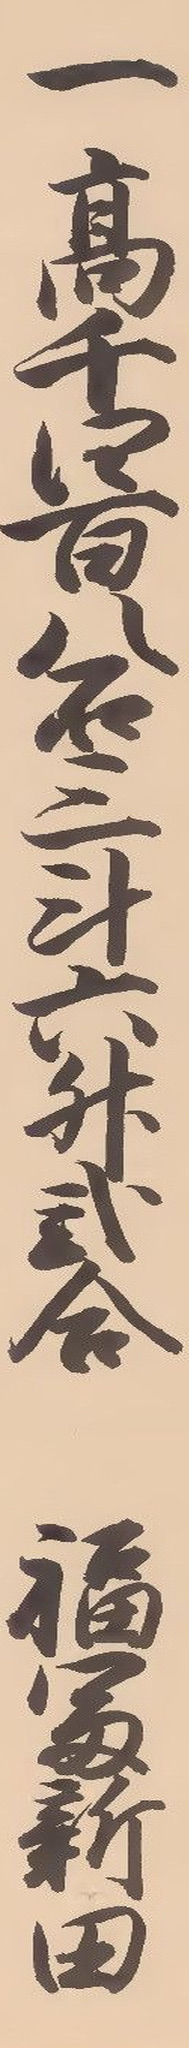一髙千四百八石三斗六升弐合福冨新田
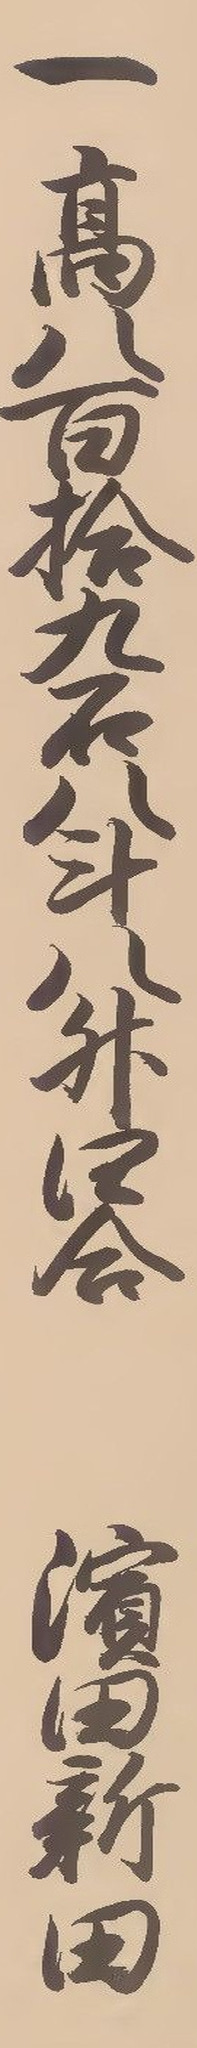一髙八百拾九石八斗八升四合濱田新田
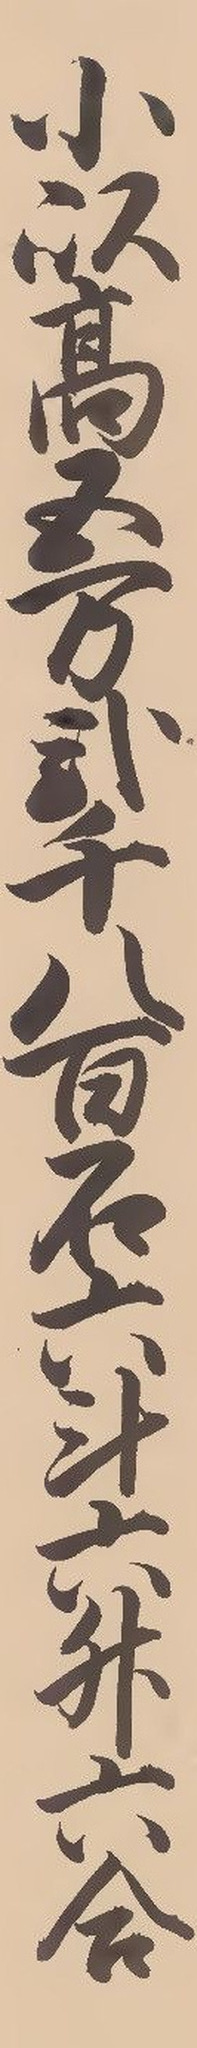小以髙五万二千八百石六斗六升六合

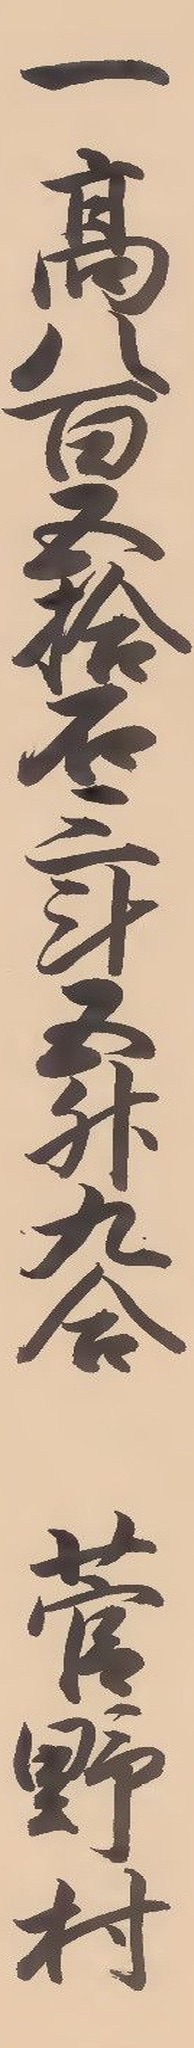一髙八百五拾石三斗五升九合菅野村
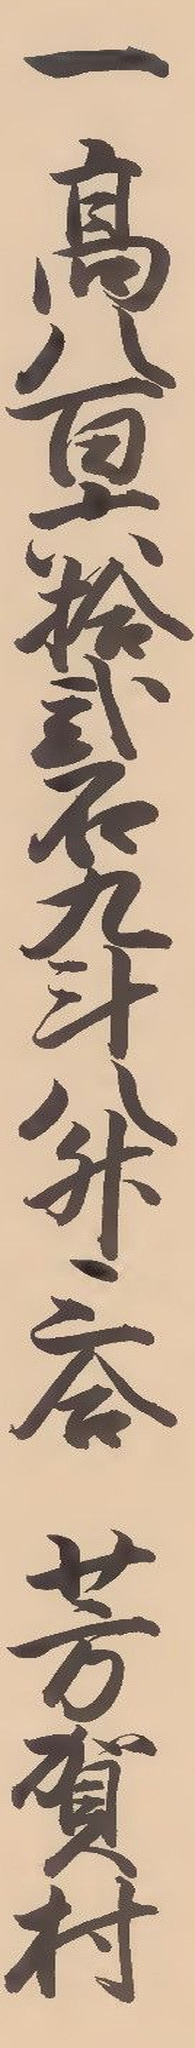一髙八百六拾弐石九斗壱升三合芳賀村
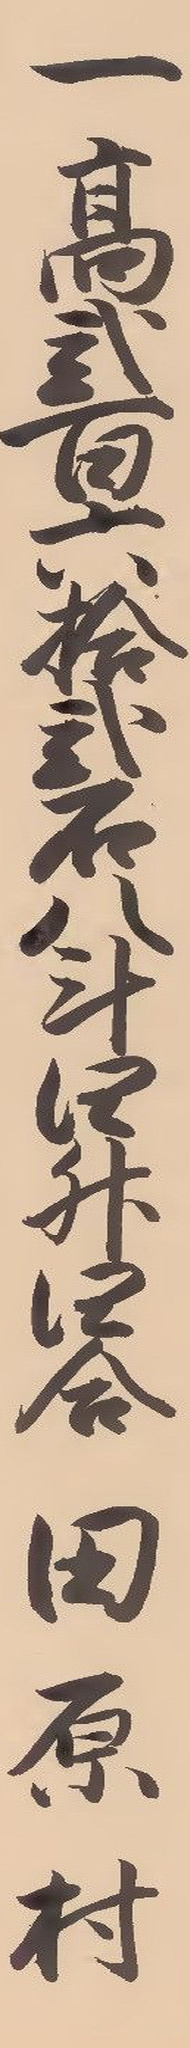一髙弐百六拾弐石八斗四升四合田原村
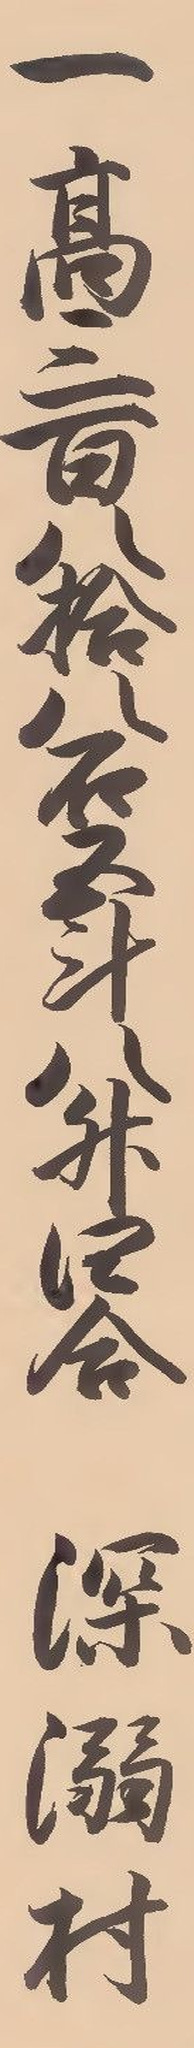一髙三百八拾八石五斗八升四合深溺村
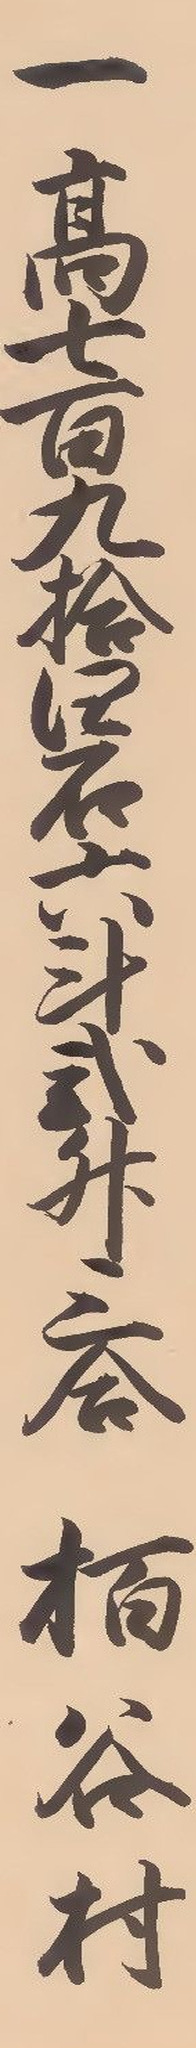一髙七百九拾四石六斗弐升三合栢谷村
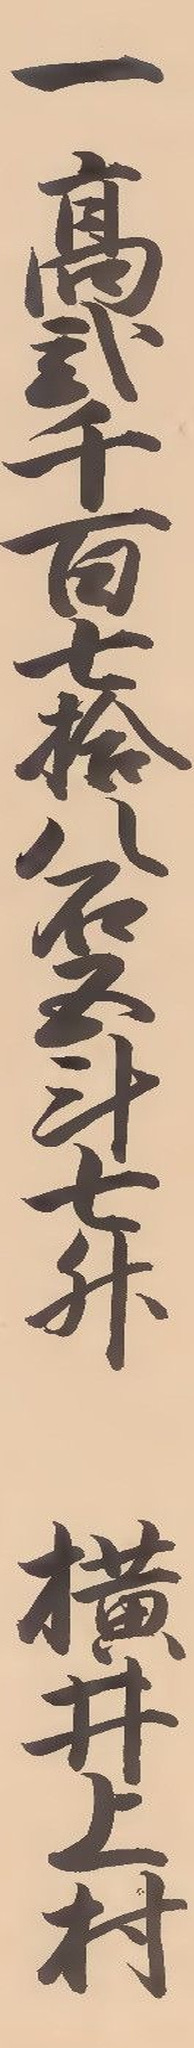一髙弐千百七拾八石五斗七升横井上村
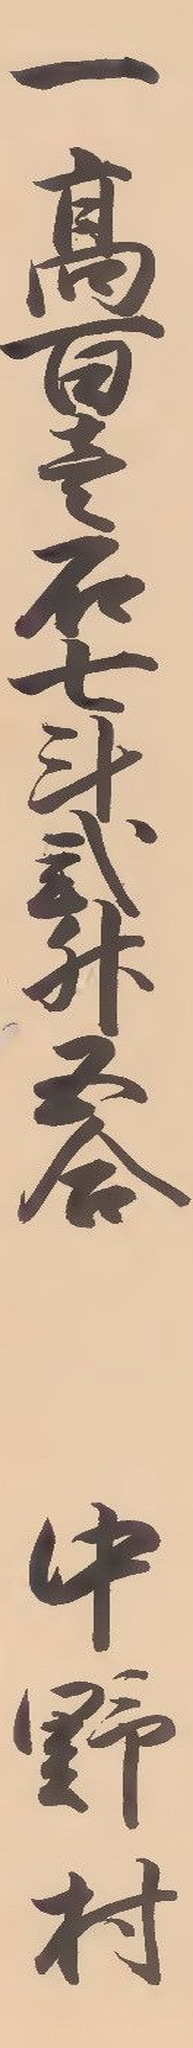一髙百壱石七斗弐升五合中野村

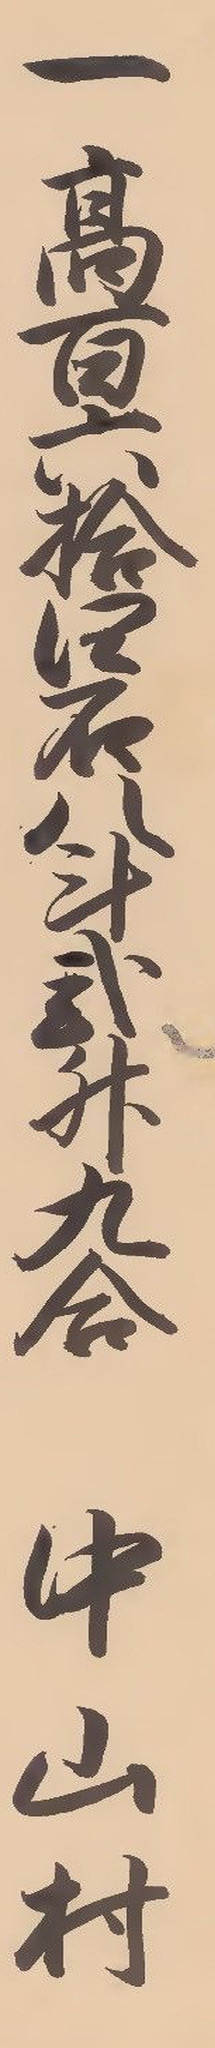一髙百六拾四石八斗弐升九合中山村
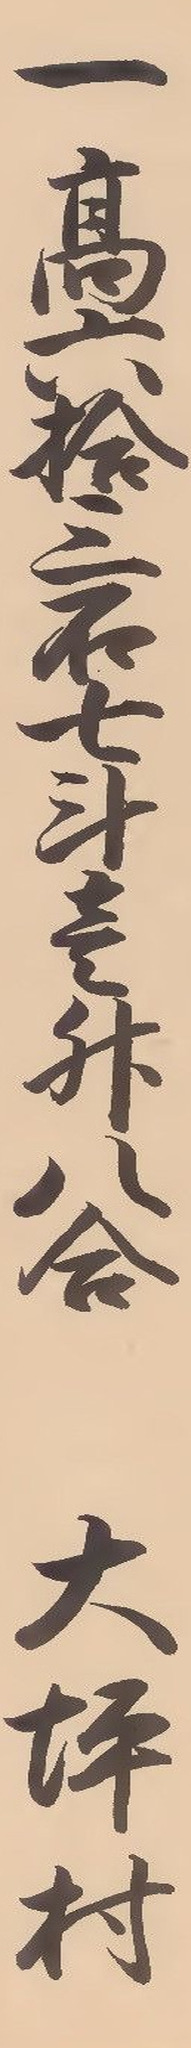一髙六拾三石七斗壱升八合大坪村
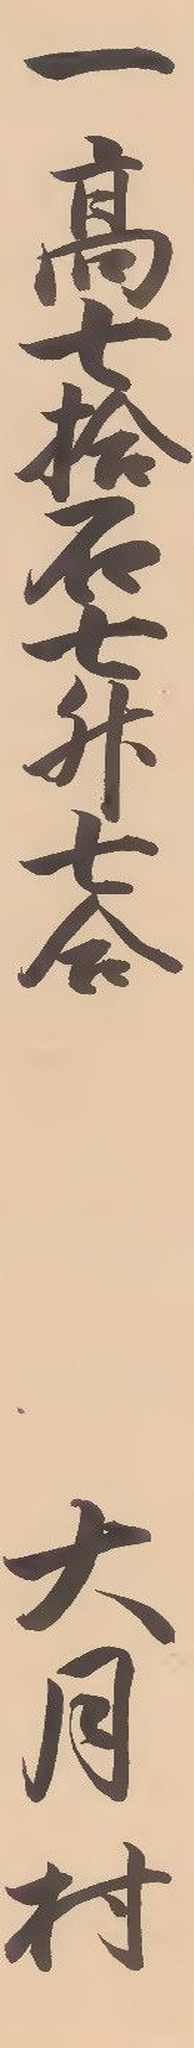一髙七拾石七升七合大月村
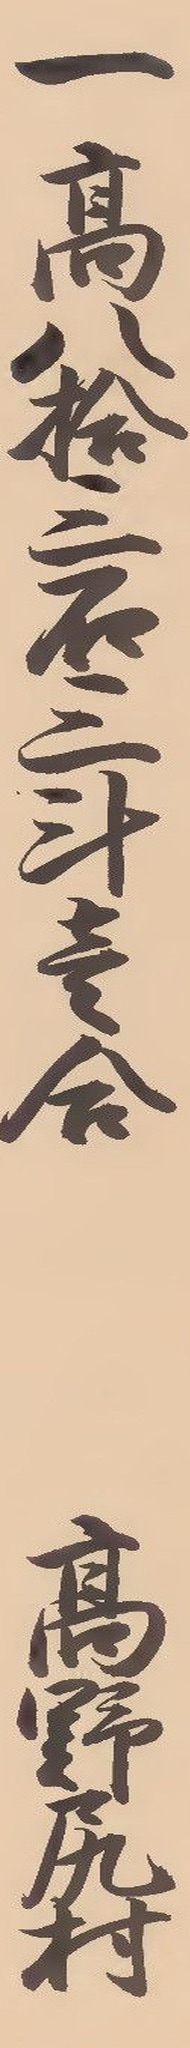一髙八拾三石三斗壱合髙野尻村
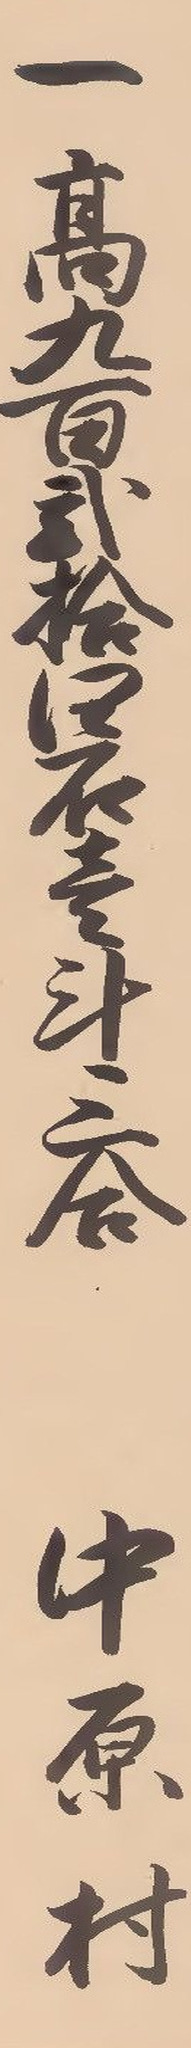一髙九百弐拾四石壱斗三合中原村
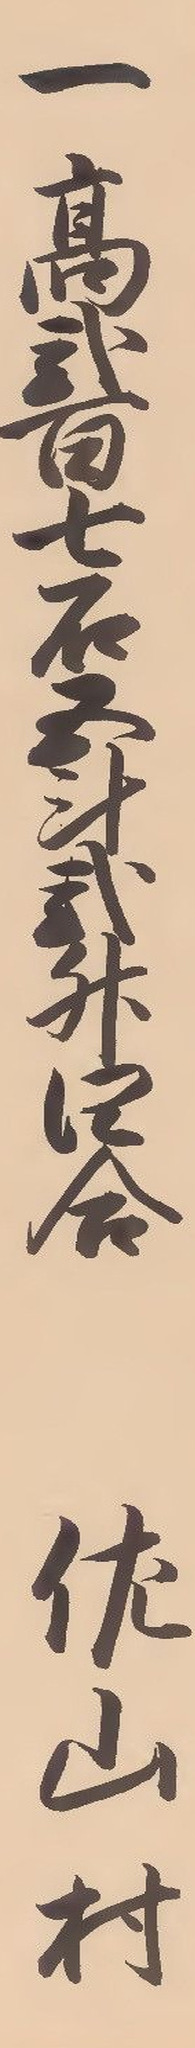一髙弐百七石五斗弐升四合佐山村
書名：備前国郷帳
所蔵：国立公文書館 National Archives of Japan
